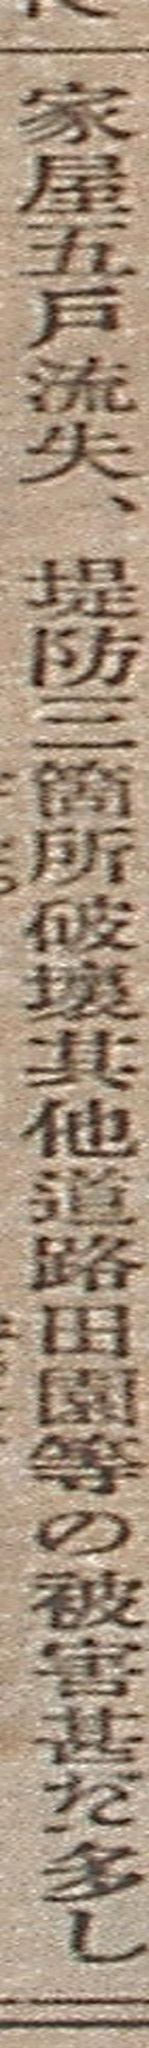家屋五戸流失、堤防三箇所破壊其他道路田園等の被害甚だ多し
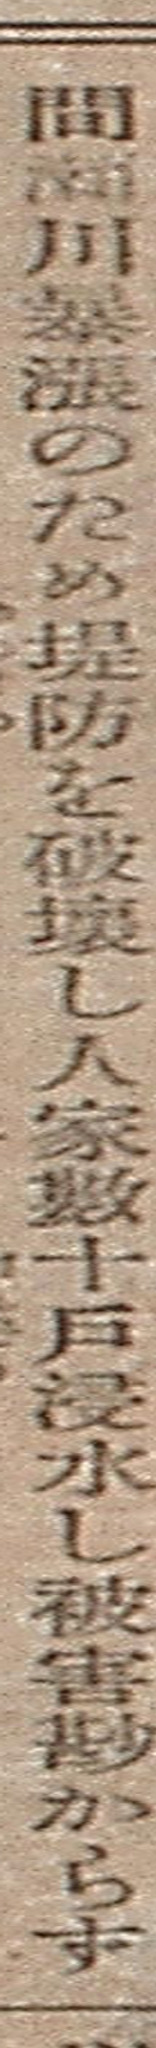間瀬川暴漲のため堤防を破壊し人家数十戸浸水し被害尠からず
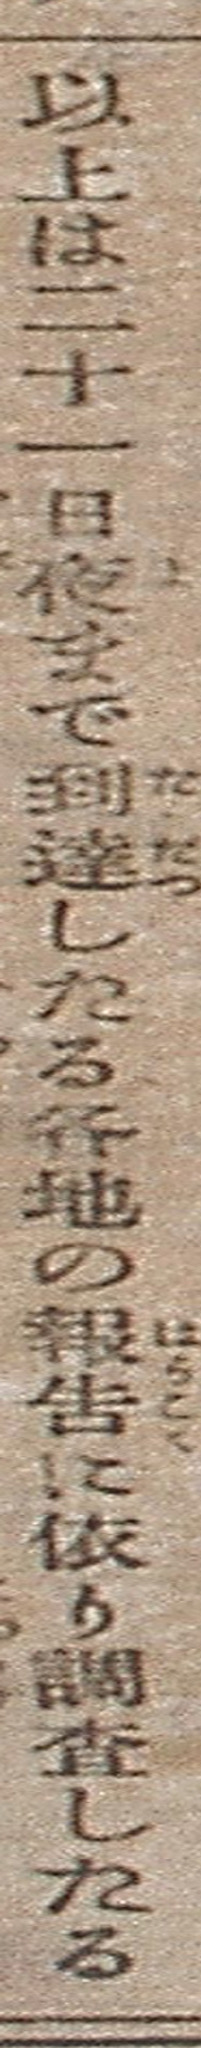以上は二十一日夜まで到達したる各地の報告に依り調査したる
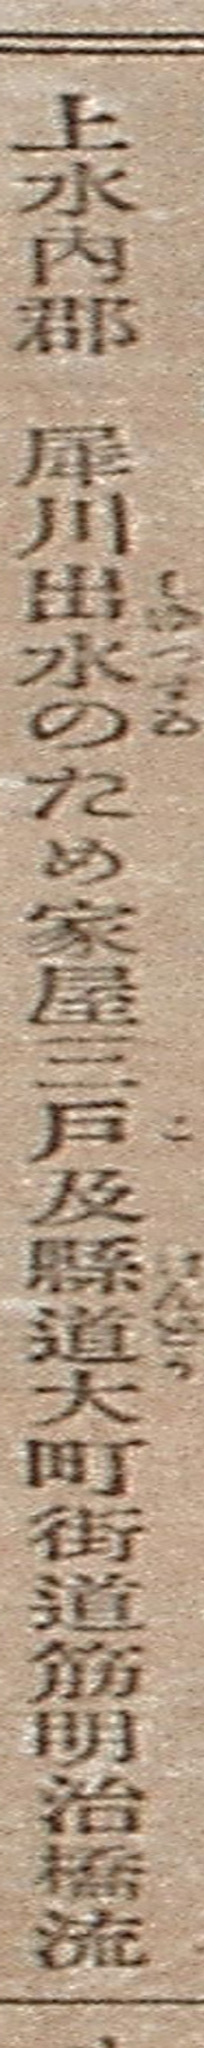上水内郡犀川出水のため家屋三戸及県道大町街道筋明治橋流
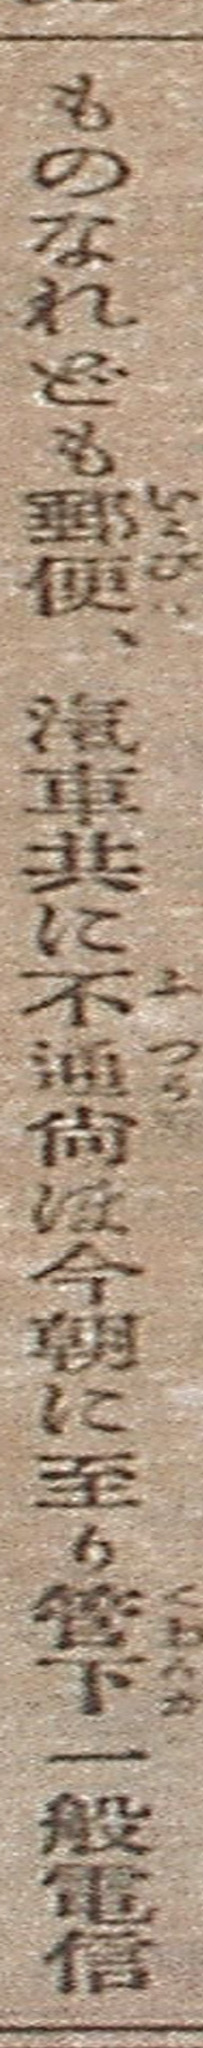ものなれども郵便、汽車共に不通尚ほ今朝に至り管下一般電信

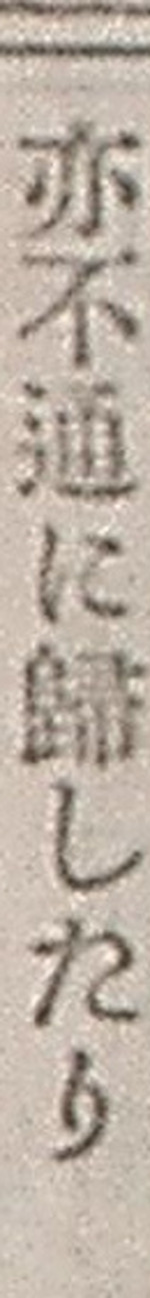亦不通に帰したり
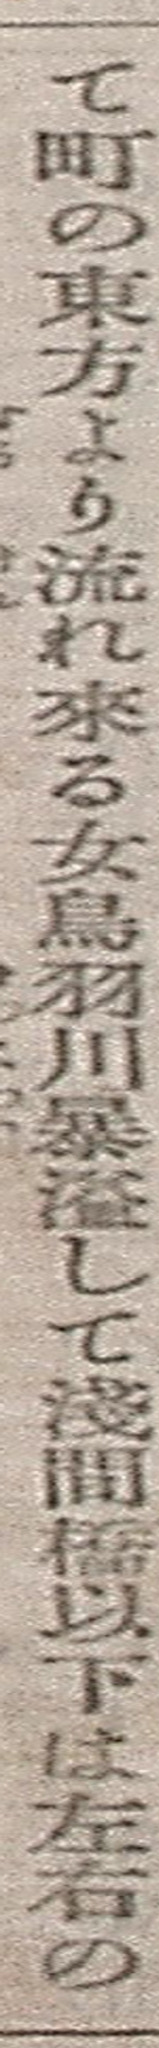て町の東方り流れ来る女鳥羽川暴溢して浅間橋以下は左右の
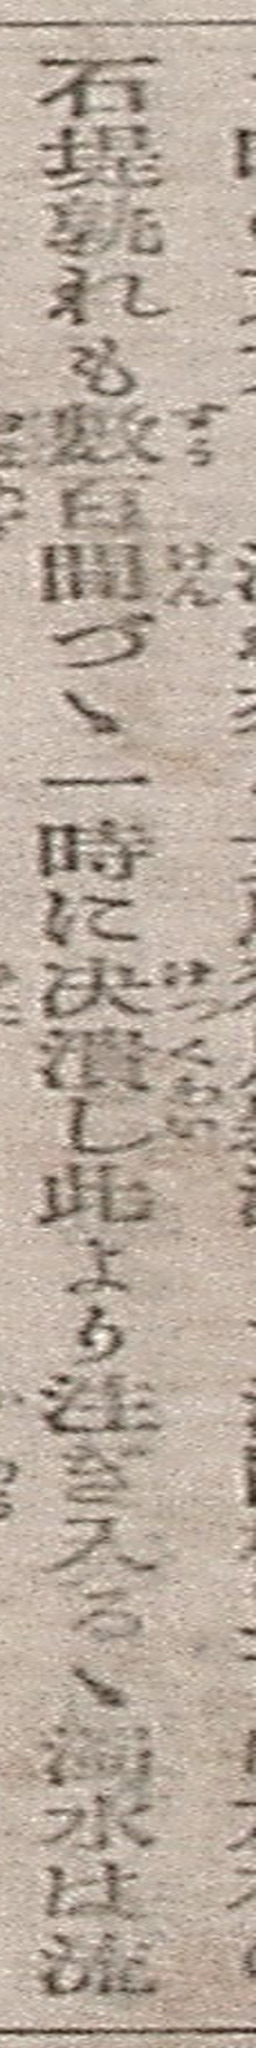石提孰れも数百間づゝ一時に决潰し此より注ぎ入るゝ濁水は流
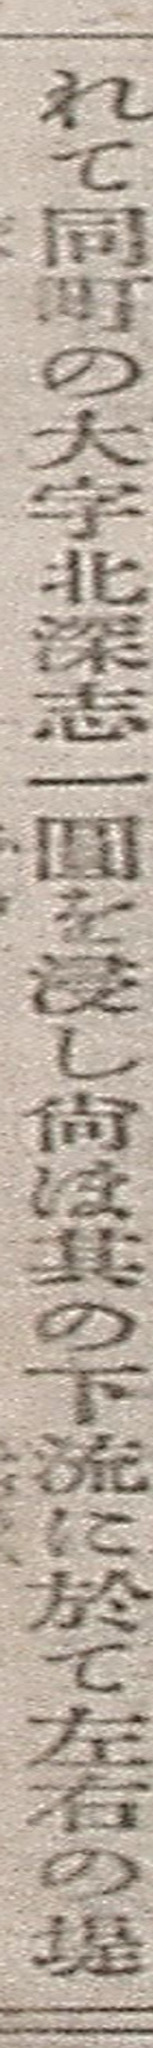れて同町の大字北深志一円を浸し尚ほ其の下流に於て左右の堤
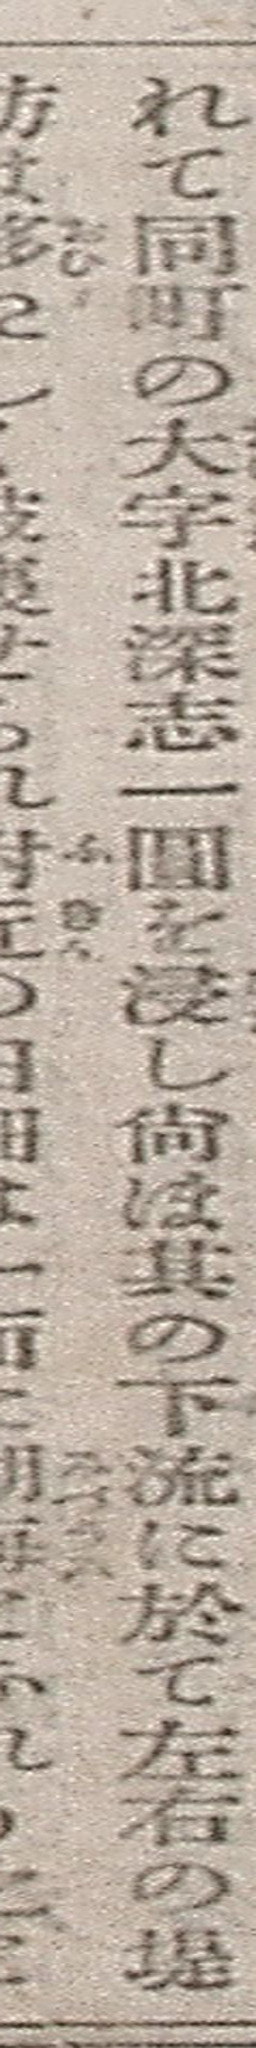防は夥だしく破壊せられ附近の田畑は一面に湖海となれり之と
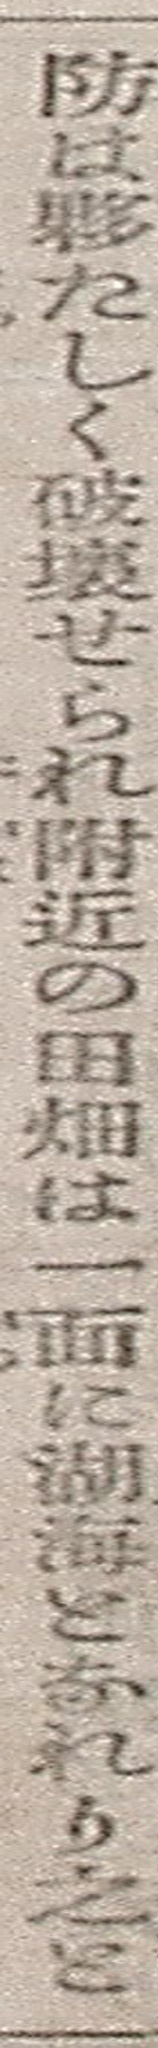防は夥だしく破壊せられ附近の田畑は一面に湖海となれり之と
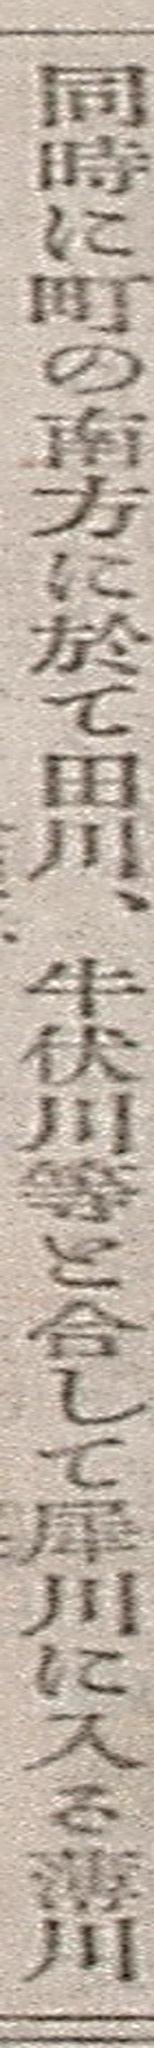同時に町の南方に於て田川、牛伏川等と合して犀川に入る薄川
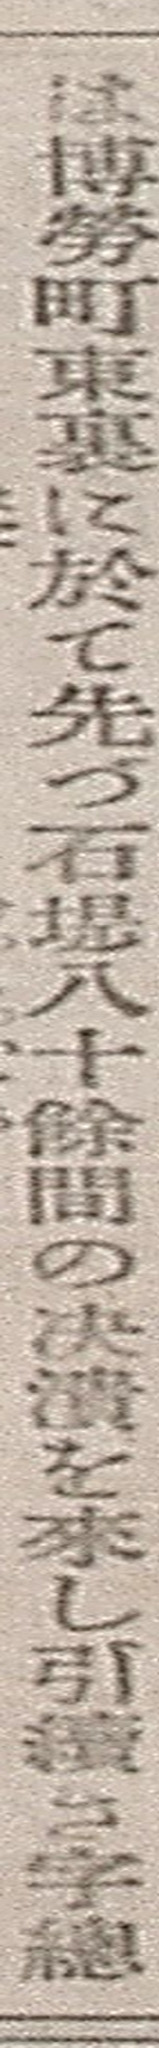は博労町東裏に於て先づ石提八十餘間の决潰を来し引続き字総
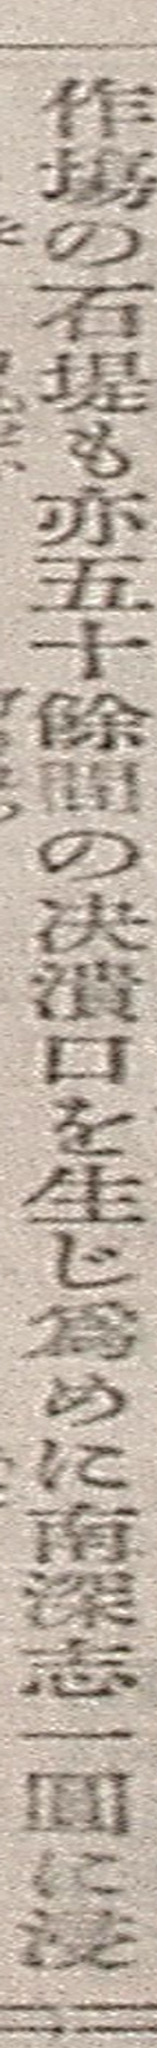作場の石提も亦五十餘間の决潰口を生じ為めに南深志一円に浸
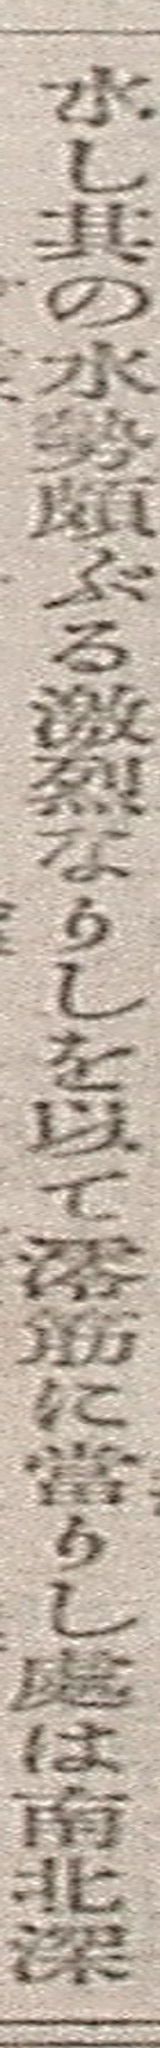水し其の水勢頗ぶる激烈なりしを以て澪筋に当りし処は南北深
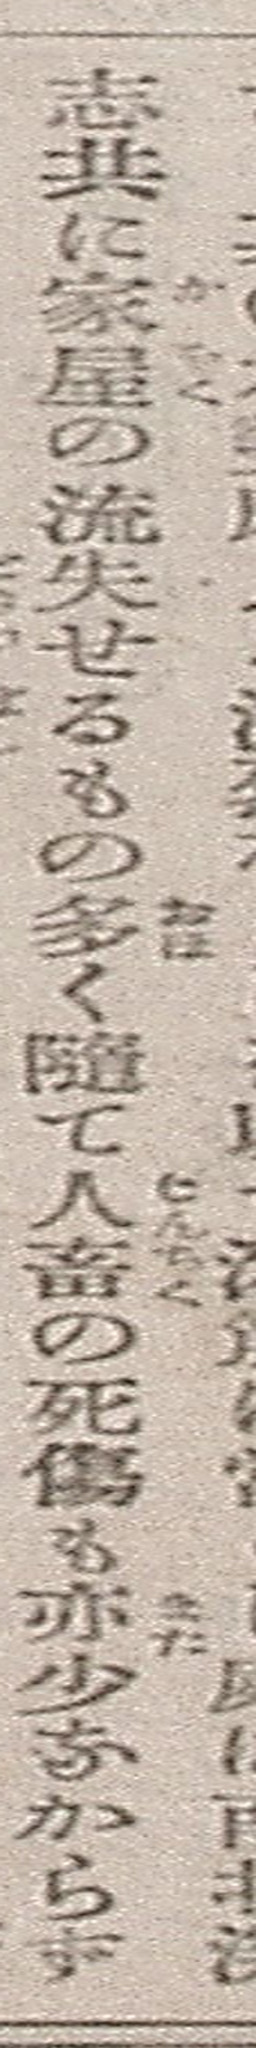志共に家屋の流失せるもの多く随て人畜の死傷も亦少なからず
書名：風俗畫報臨時増刊第百二十六號　洪水被害録（中）
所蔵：東京大学地震研究所図書室 Earthquake Research Institute Library, The University of Tokyo, JAPAN
